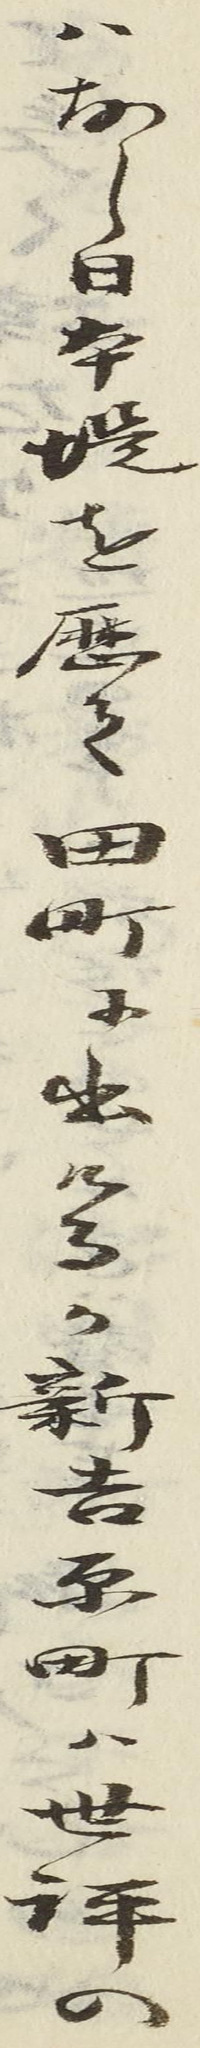ハなし日本堤を歴て田町に出けるか新吉原町ハ世評の
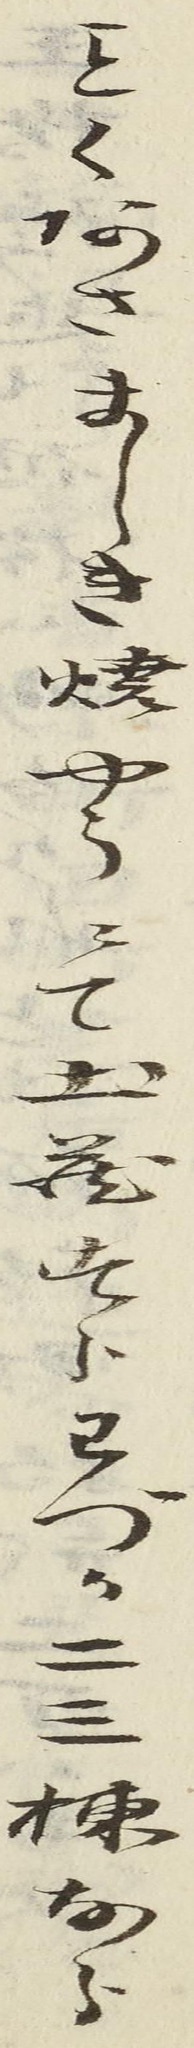ことくあさましき焼やう二て土蔵すらわづか二三棟なら
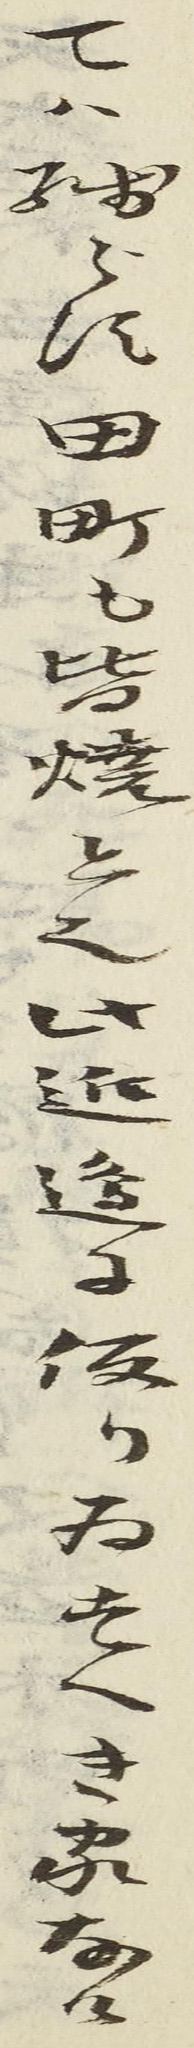てハ残らす田町も皆焼と也此近辺に仮りゐすへき家なけ
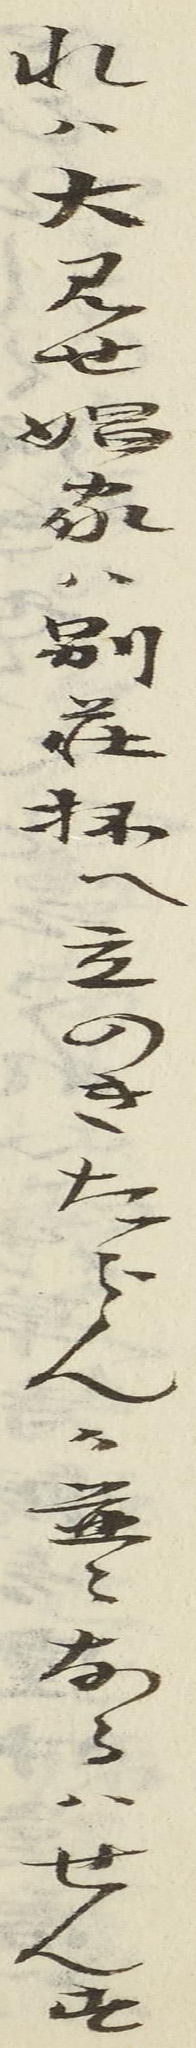れハ大見せ娼家ハ別荘抔へ立のきたらんか並々ならハせんす
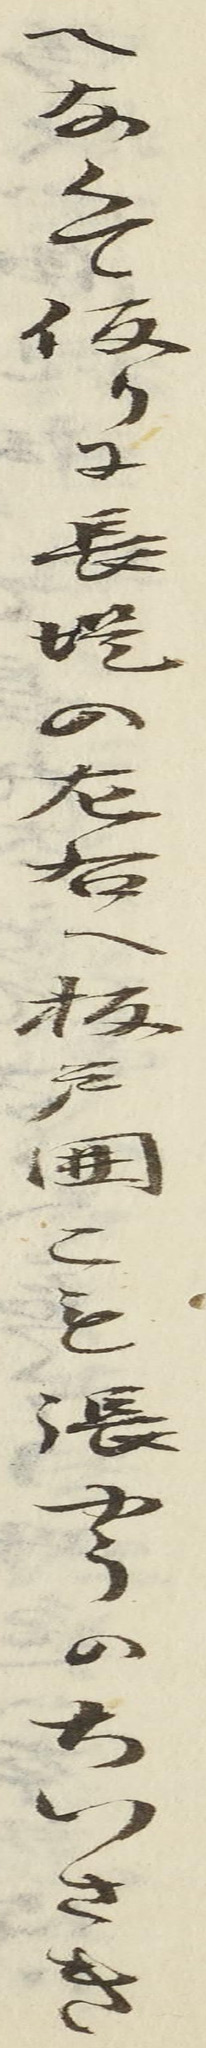へなくて仮りに長堤の左右へ板戸囲こも張やうのちいさき
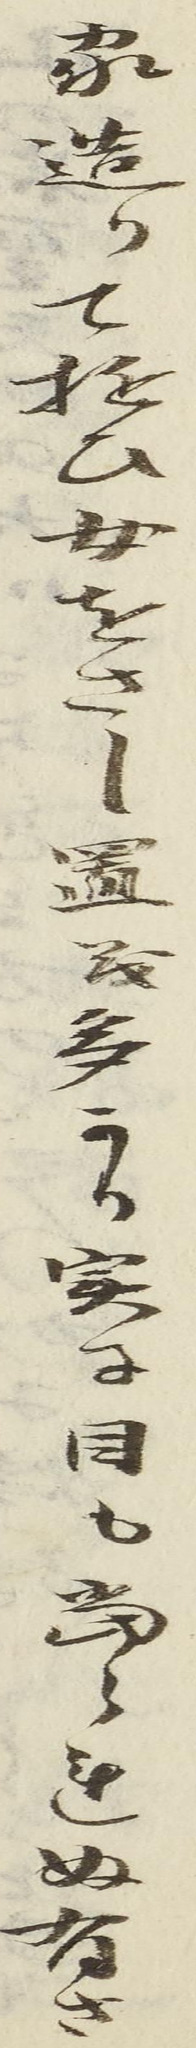家造りて遊ひ女をさし置も多かた実に目も当られぬ有さ
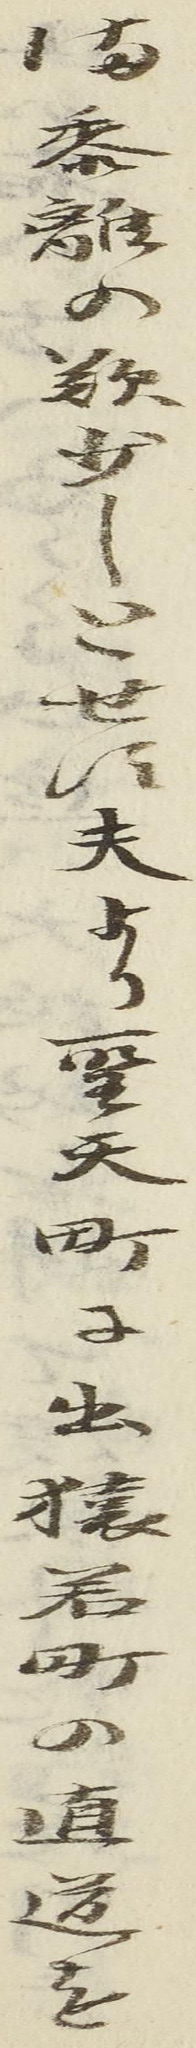ま黍離の歎少しとせす夫より聖天町に出猿若町の直道を

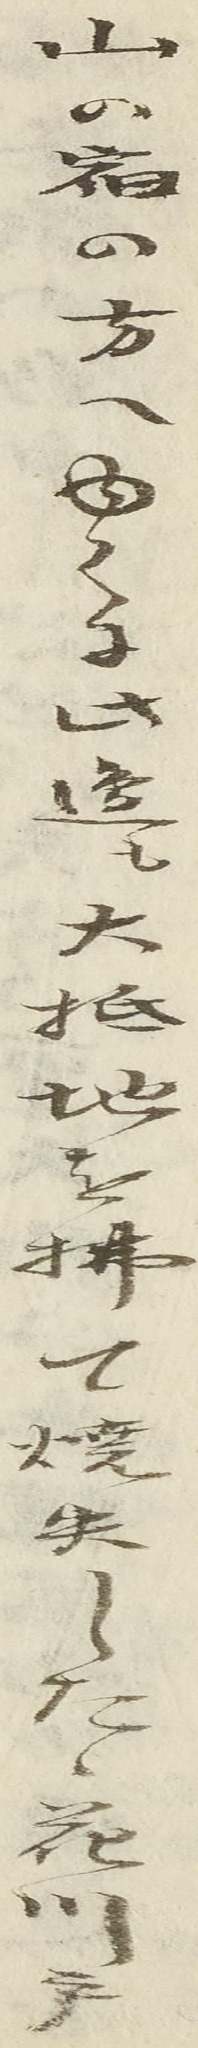山の宿の方へゆくに此辺も大低地を拂て焼失したゝ花川戸
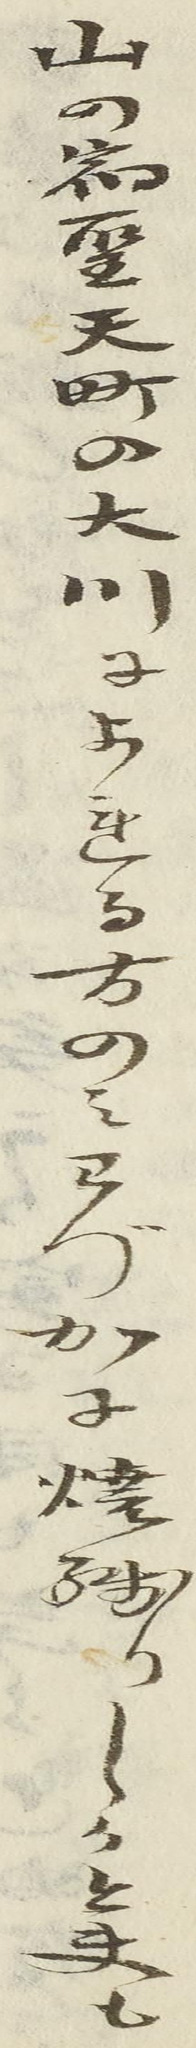山の宿聖天町の大川によれる方のミわづかに焼残りしかと夫も
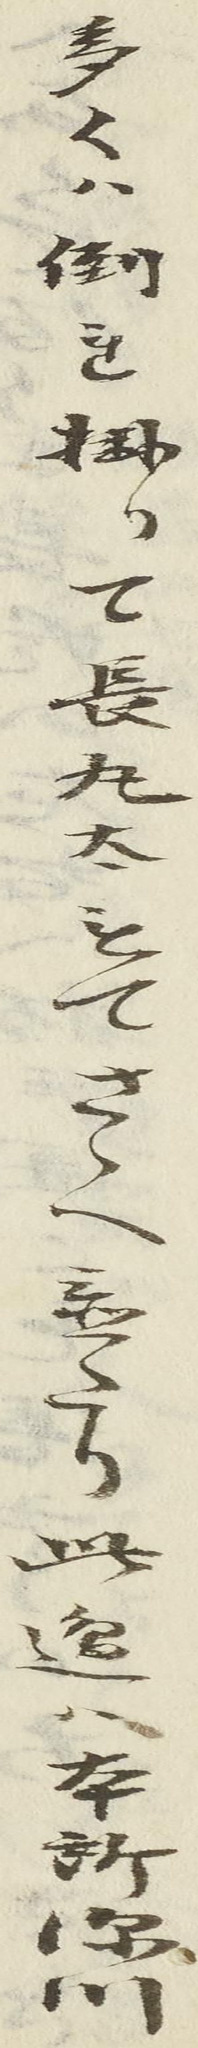多くハ倒れ掛りて長丸太もてさゝへ置たり此辺ハ本所深川
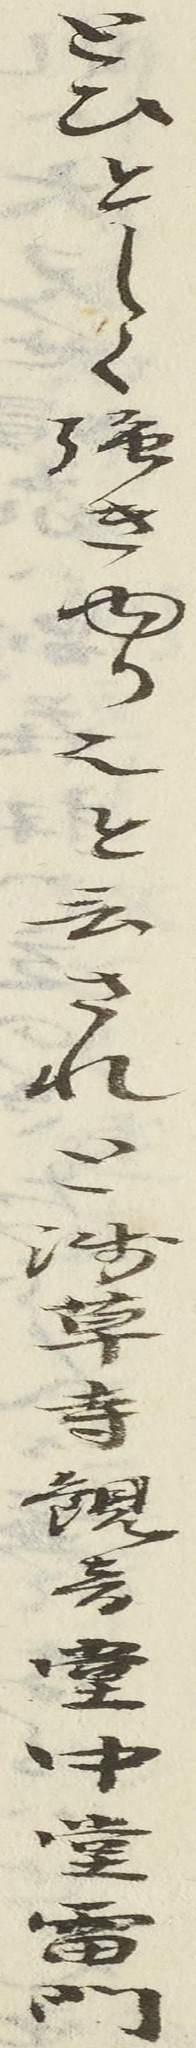とひとしく強きゆり也と云されと浅草寺観音堂中堂雷門
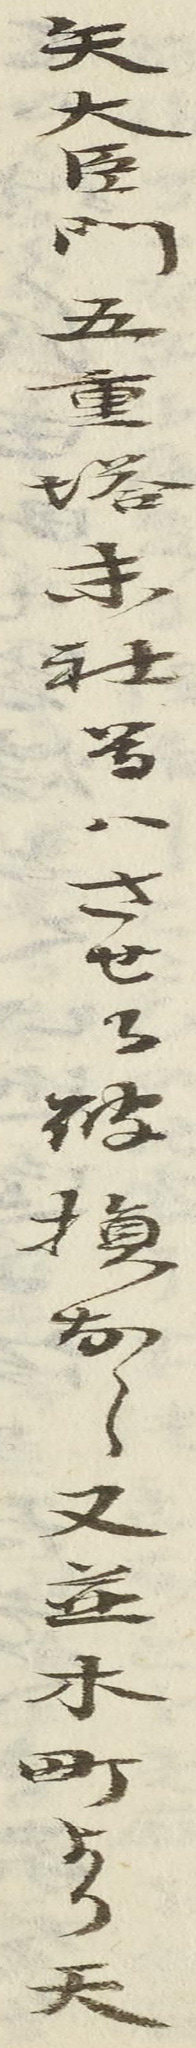矢大臣門五重塔未社等ハさせる破損なし又並木町より天
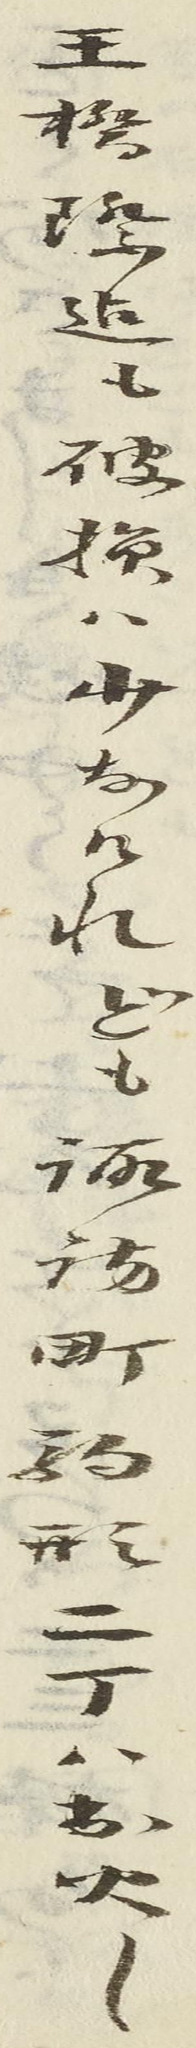王橋際迄も破損ハ少なれども諏訪町駒形二丁目ハ出火し
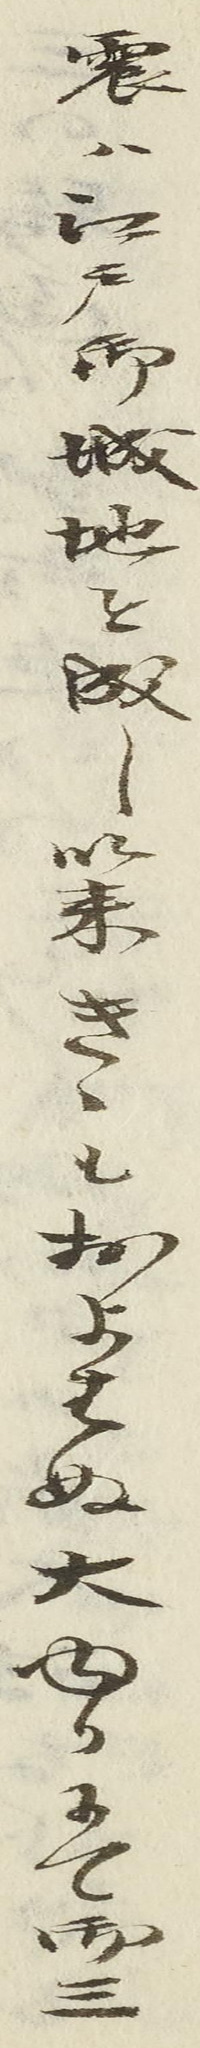震ハ江戸御城地を成し以来きゝもおよはぬ大ゆりにて御三
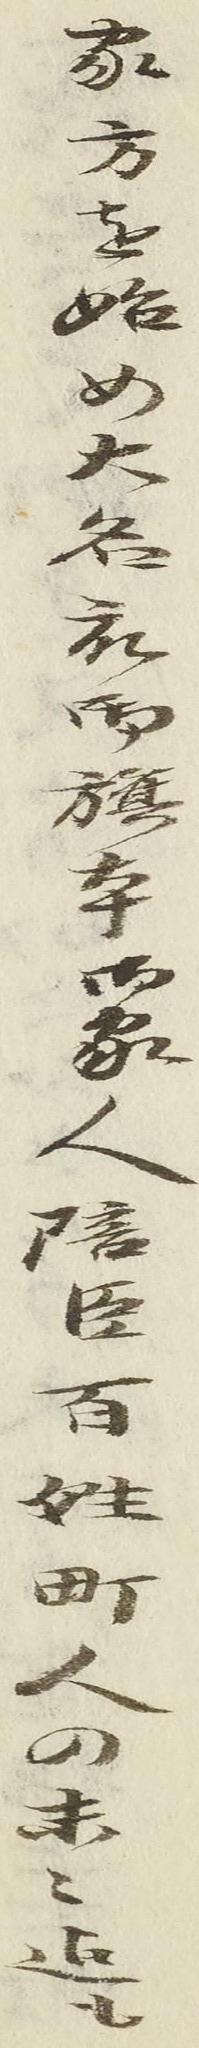家方を始め大名衆御旗本御家人陪臣百姓町人の未々迄も
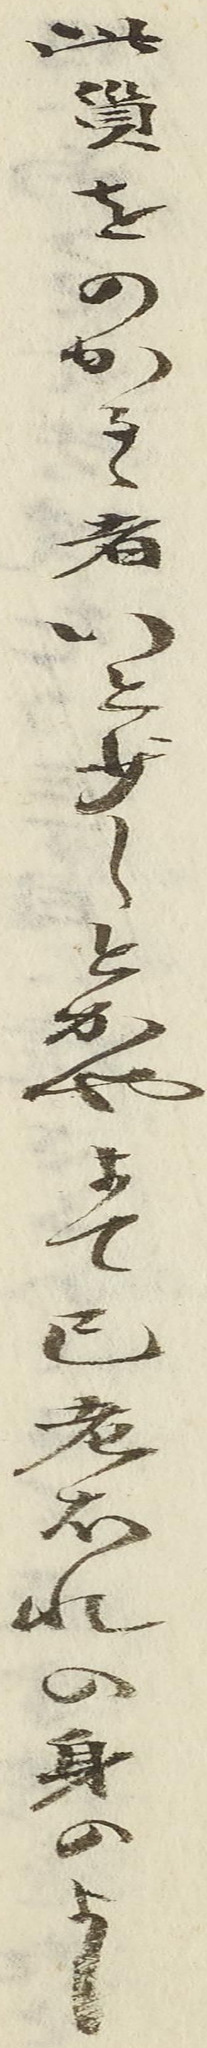此災をのかるゝ者いと少しとかやよて己老ほれの身のよし
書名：那為の後見艸　全
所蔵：東京大学地震研究所図書室 Earthquake Research Institute Library, The University of Tokyo, JAPAN
